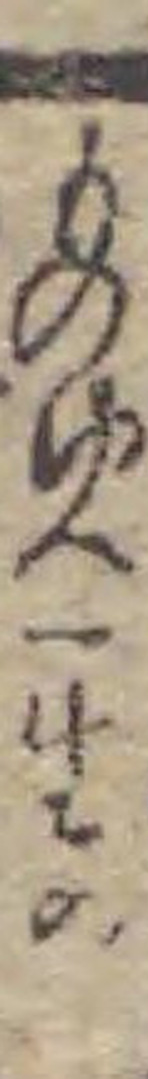ものゆへ一生の
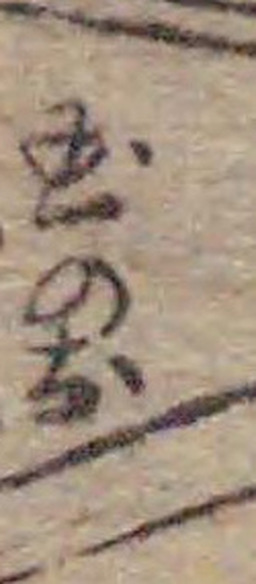玉のお
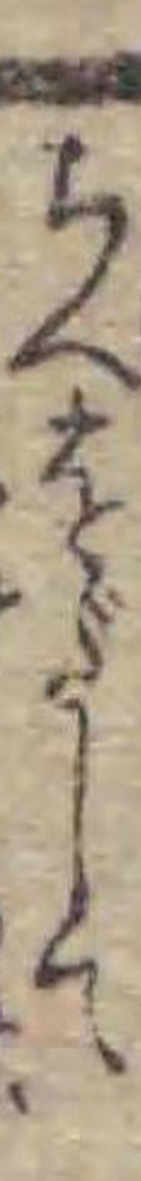ちへをだして
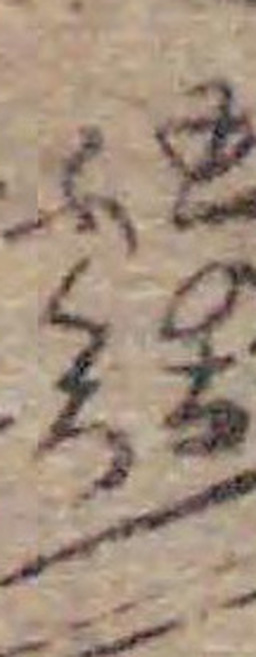ふくろ
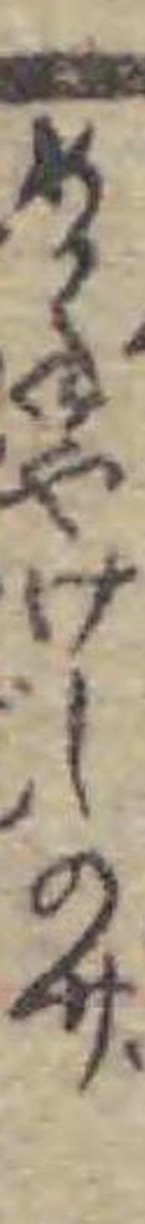めかねやけしの介
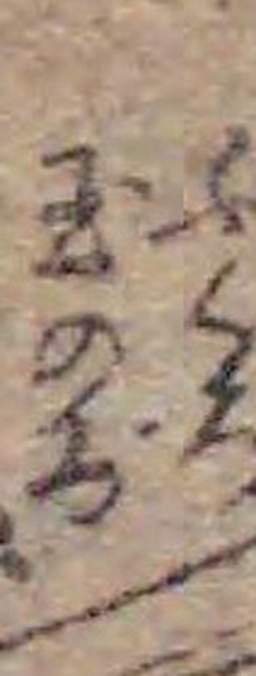玉のお
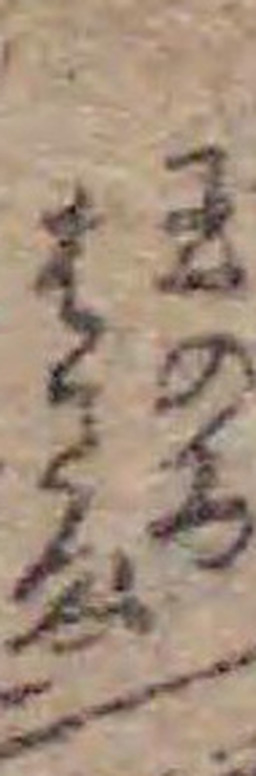はさま
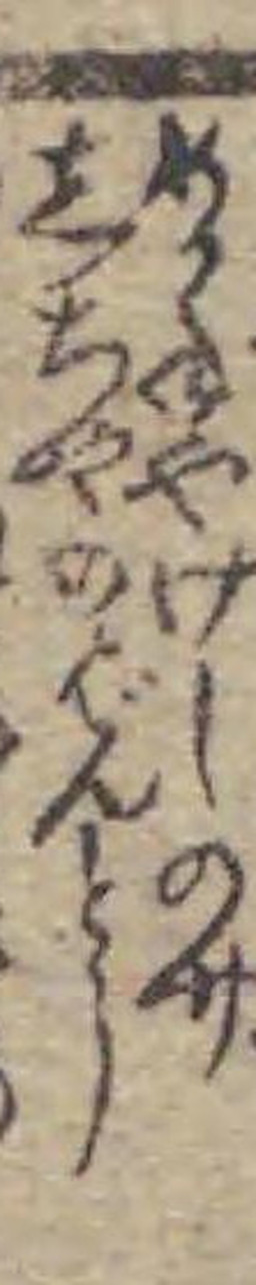しちやのばんとう
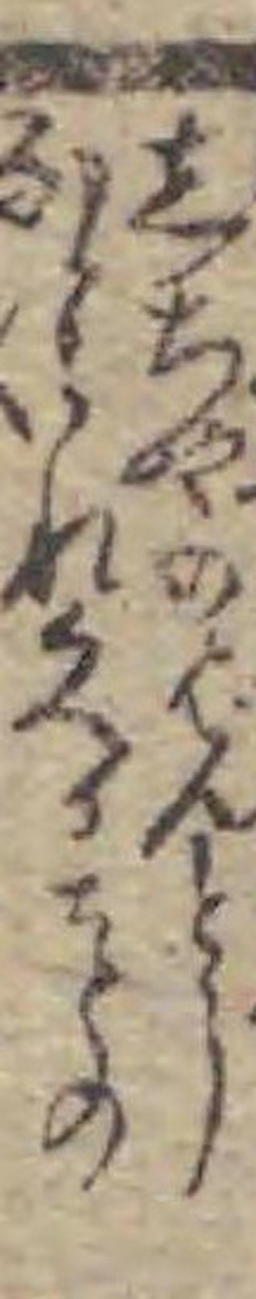なといれかへることの
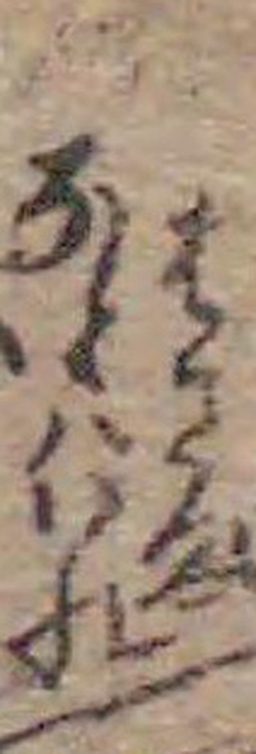なとはいれ
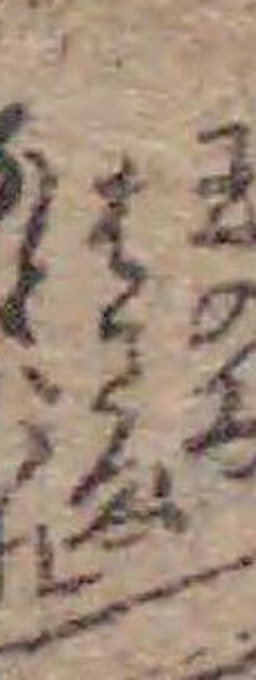はさま
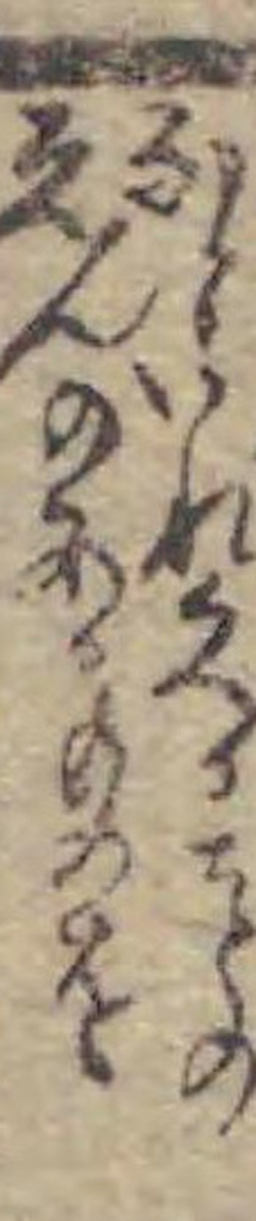ゑんのあるものを
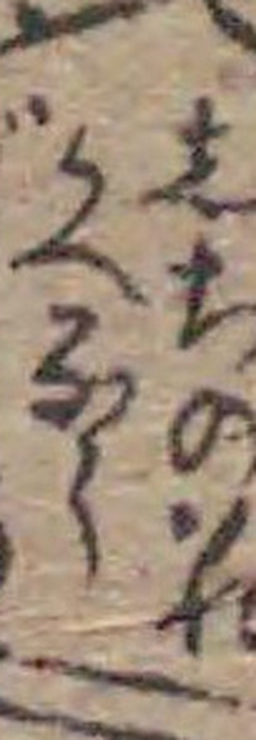かへなら
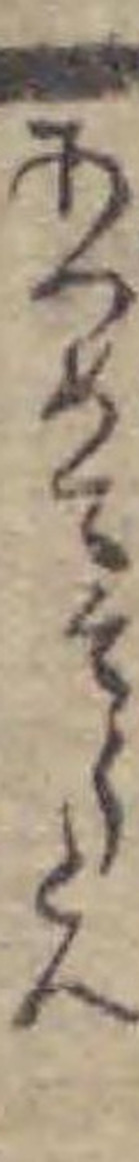あつめてそうたん
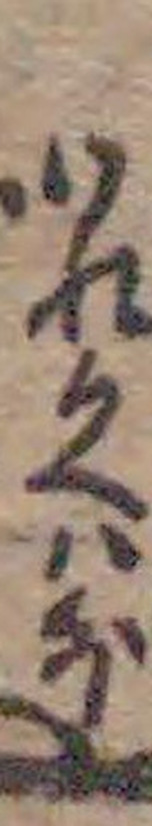いれかへは外へ
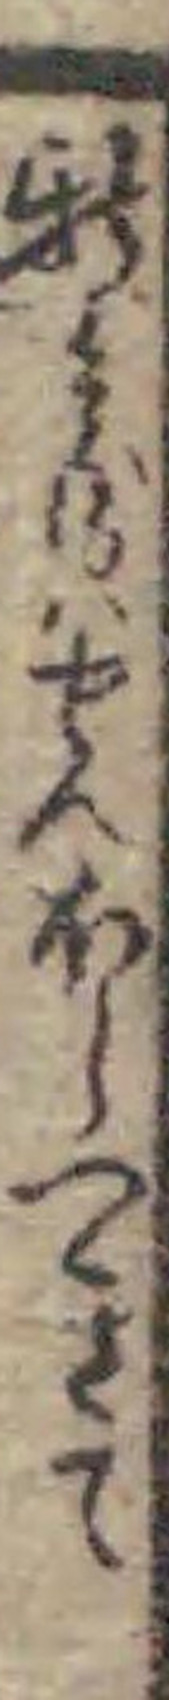新兵衛はせんほうつきて
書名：江戸花俳優贔屓 : 3巻
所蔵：国立国会図書館 National Diet Library, JAPAN
